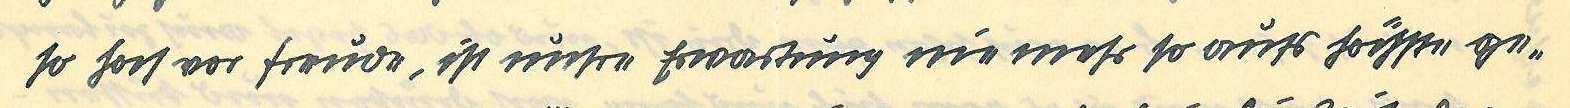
so hoch vor Freude, ist unsre Erwartung nie mehr so aufs höchste ge¬
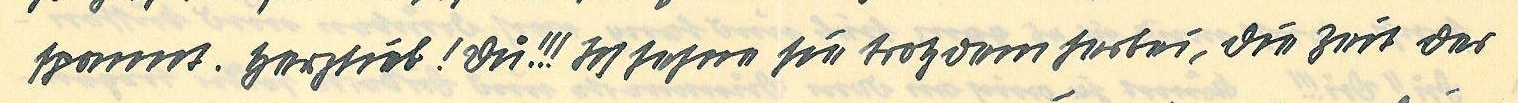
spannt. Herzlieb! Du!!! Ich sehne sie trotzdem herbei, die Zeit der
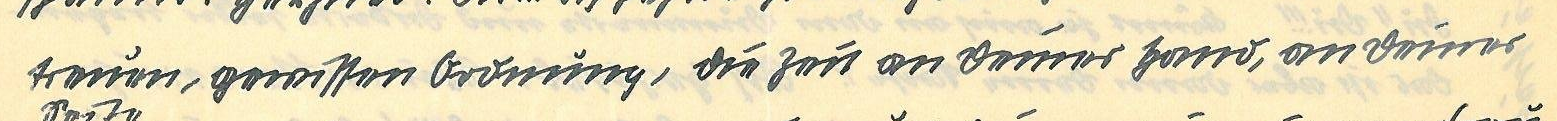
treuen, gewissen Ordnung, die Zeit an Deiner Hand, an Deiner
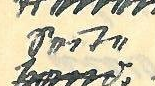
Seite
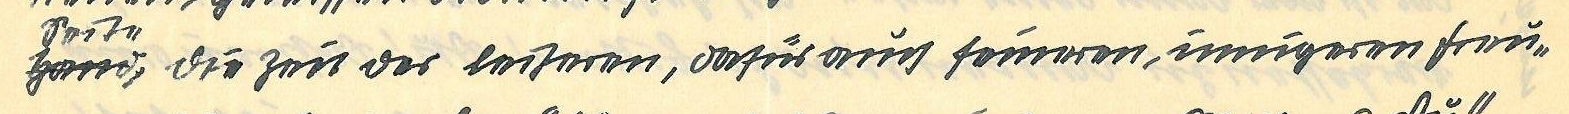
die Zeit der leiseren, dafür auch feineren, innigeren Freu¬
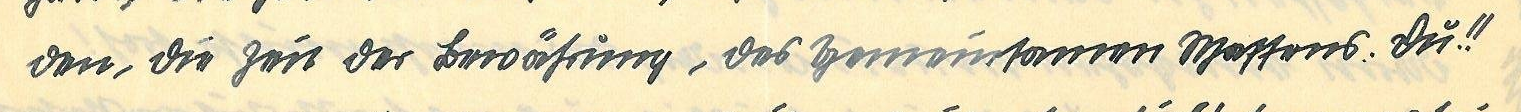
den, die Zeit der Bewährung, des gemeinsamen Schaffens. Du!!
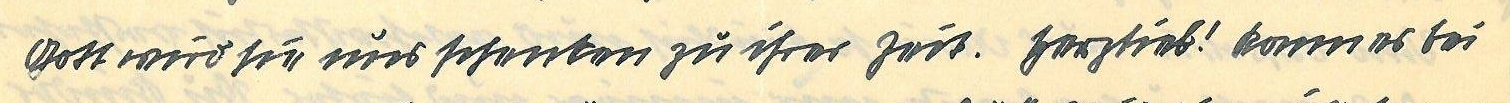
Gott wird sie uns schenken zu ihrer Zeit. Herzlieb! Kann es bei
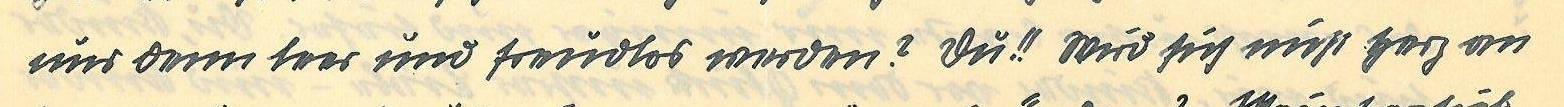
uns denn leer und freudlos werden? Du!! Wird sich nicht Herz an
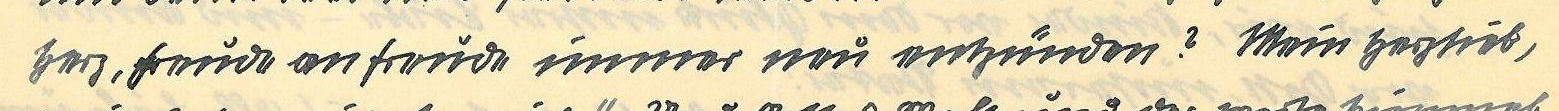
Herz, Freude an Freude immer neu entzünden? Mein Herzlieb,
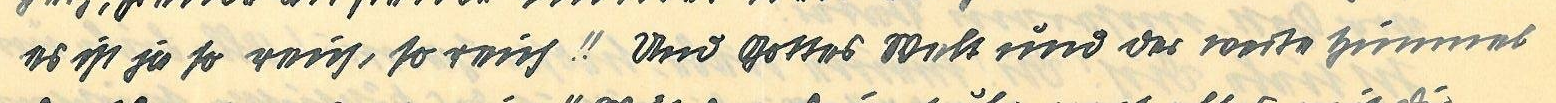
es ist ja so reich, so reich!! Und Gottes Welt und der weite Himmel
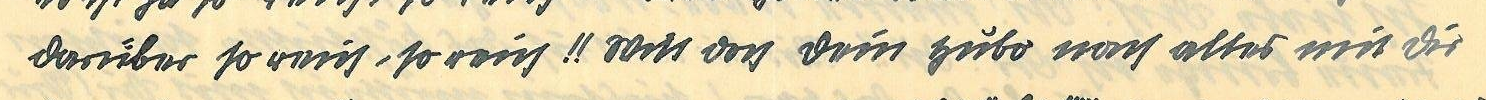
darüber so reich, so reich!! Will doch Dein Hubo noch alles mit Dir
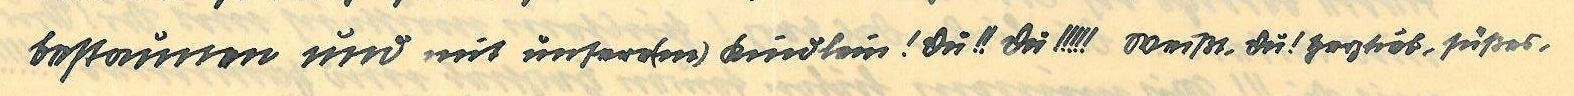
bestaunen und mit unsere(m) Kindlein! Du!! Du!!!!! Weißt, Du! Herzlieb, süßes,
